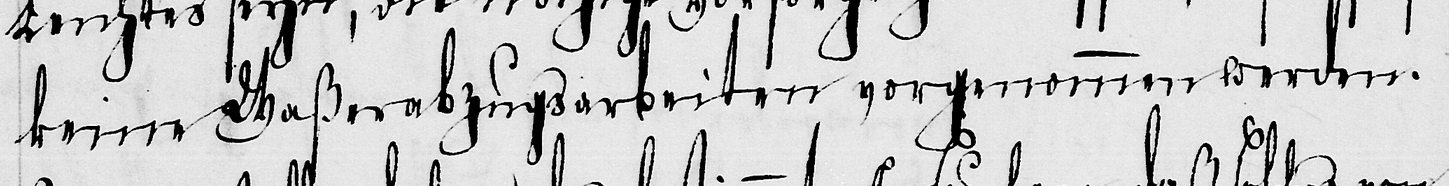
keine Waßerabzugsarbeiten vorgenommen werden.
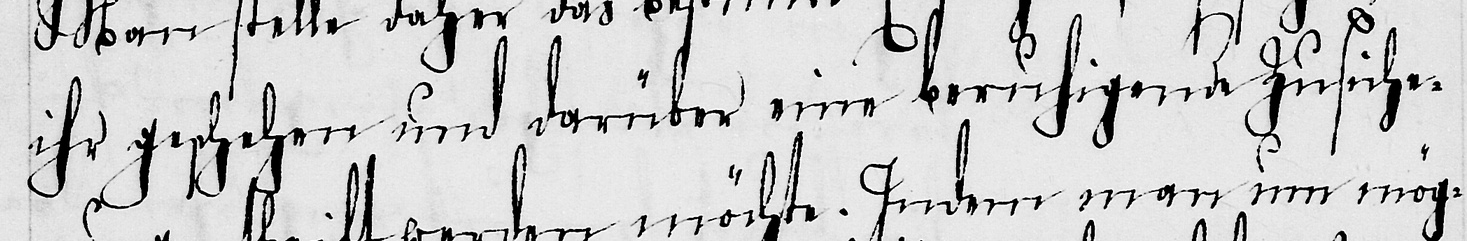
ihr geschehen und darüber eine beruhigende Zusiche¬
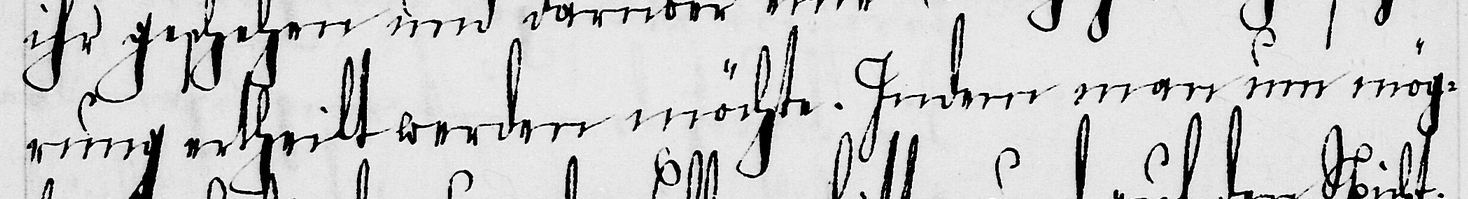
rung ertheilt werden möchte. Indem man um mög¬
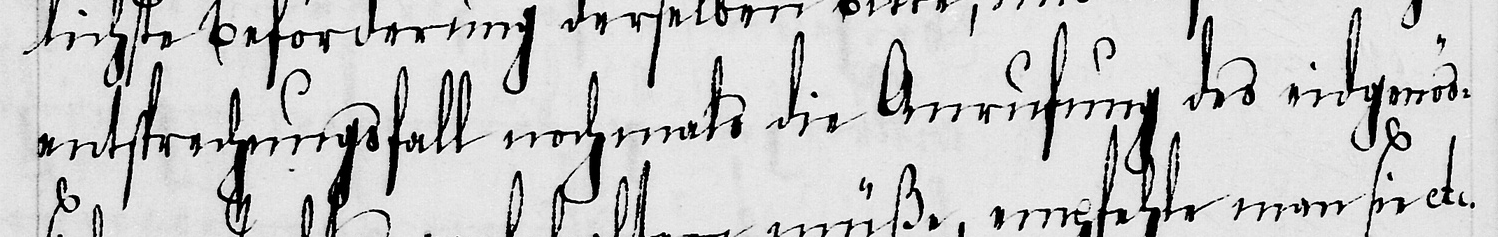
entsprechungsfall nochmals die Anrufung des eidgenö¬
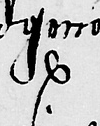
den
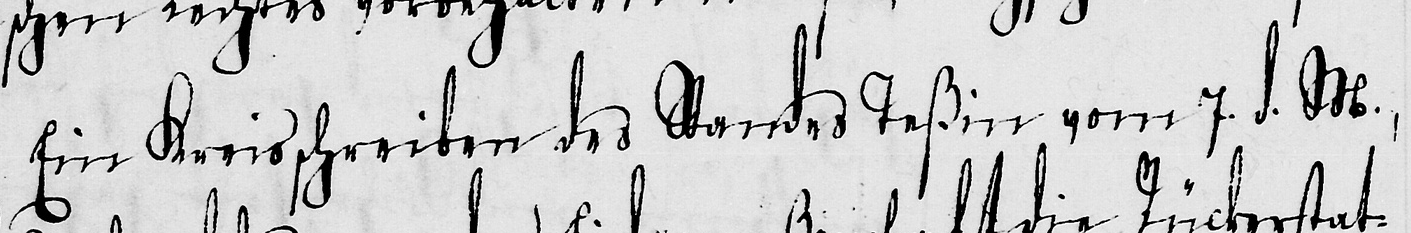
Ein Kreisschreiben des Standes Teßin vom 7. d. M.,
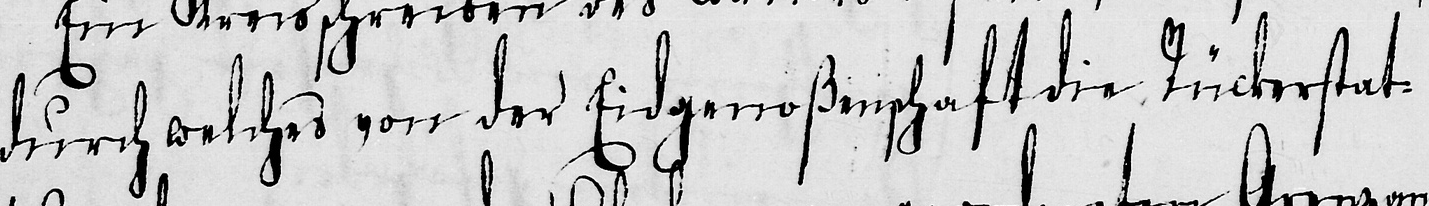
durch welches von der Eidgenoßenschaft die Rückerstat¬
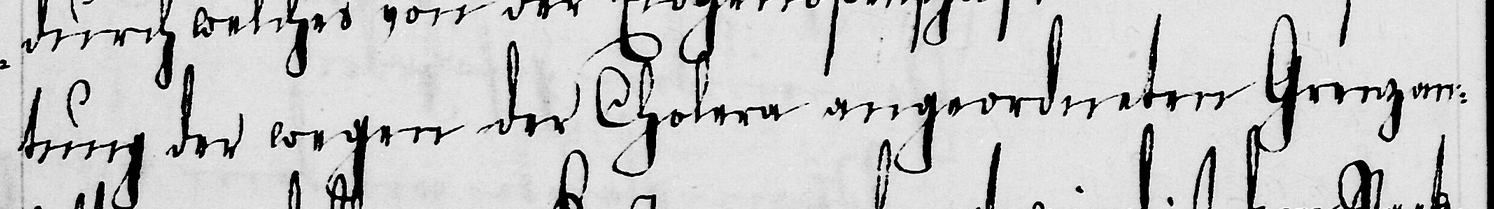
tung der wegen der Cholera angeordneten Grenzans¬
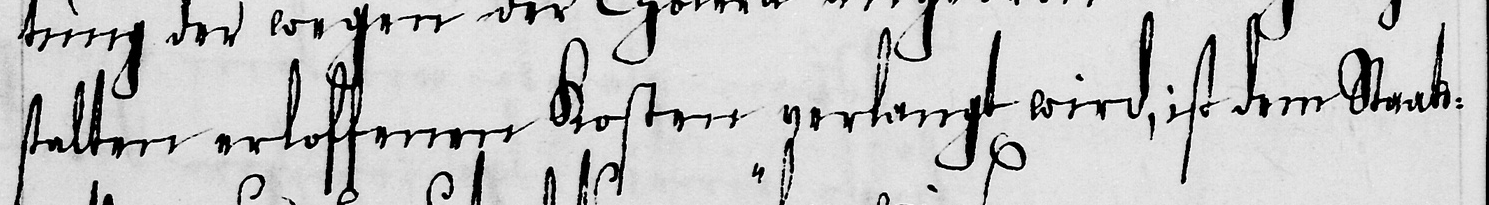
talten erloffenen Kosten verlangt wird, ist dem Staat¬
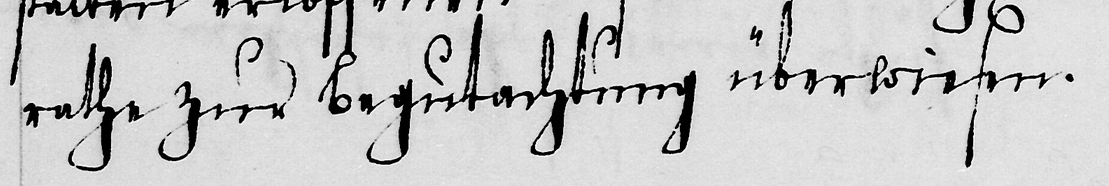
srathe zur Begutachtung überwiesen.
